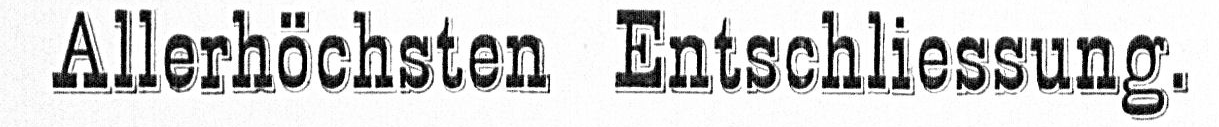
Allerhöchsten Entschliessung.
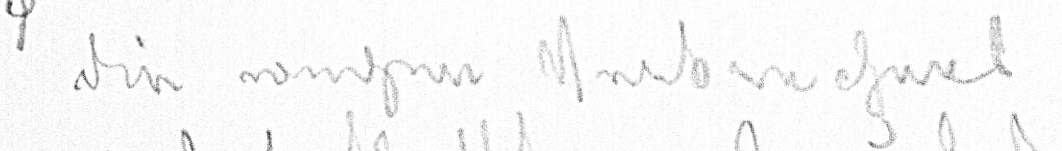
Die wegen Verbrechens
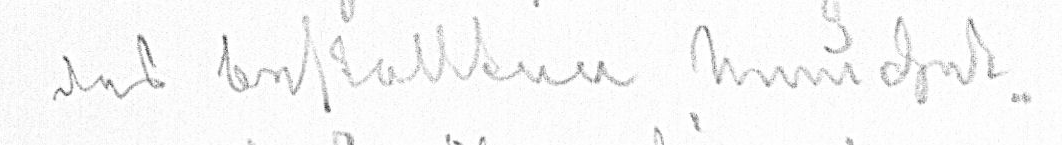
des bestrollten Meuchel¬
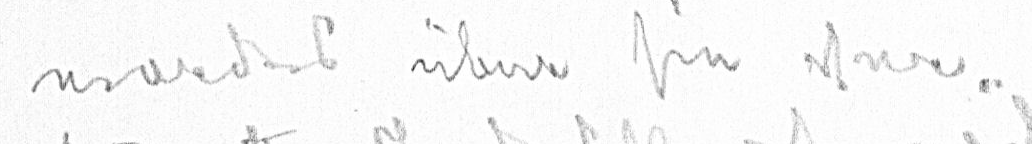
mordes über sie ver¬
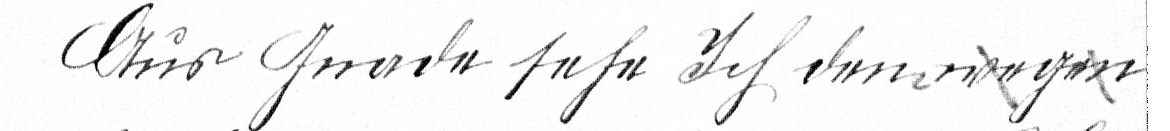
Aus Gnade sehe Ich den wegen
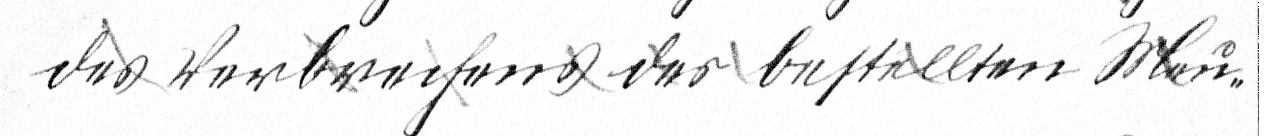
des Verbrechens des bestellten Meu¬
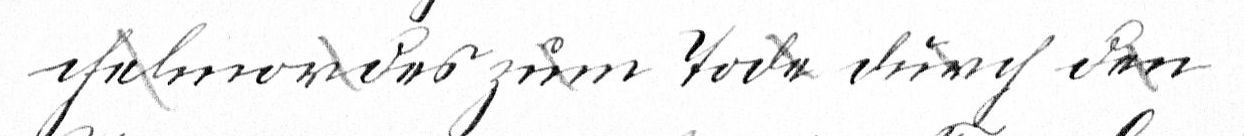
chelmordes zum Tode durch den
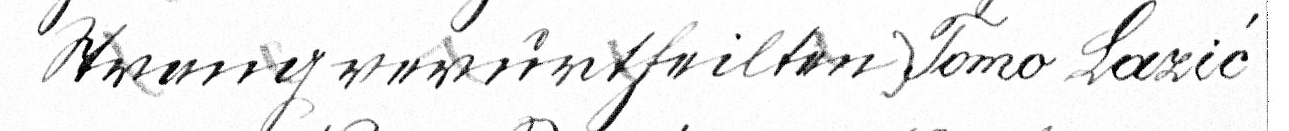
Strangverurtheilten Tomo Lazić
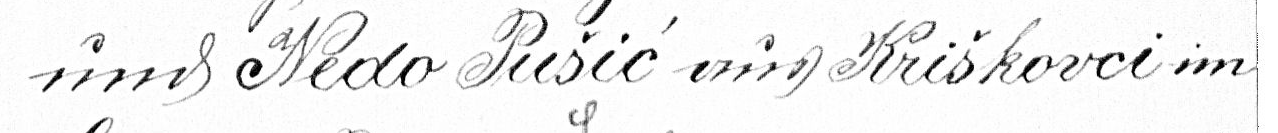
und Nedo Pusić aus Kriskovci im
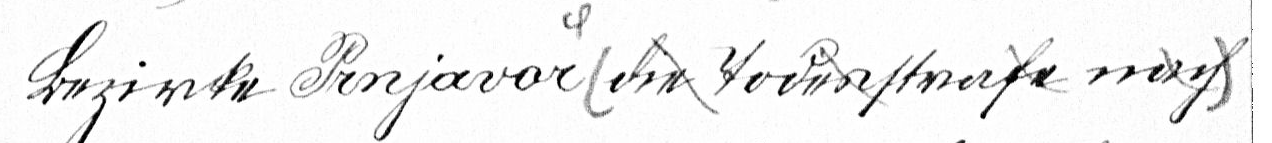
Bezirke Prnjavor (die Todesstrafe nach)
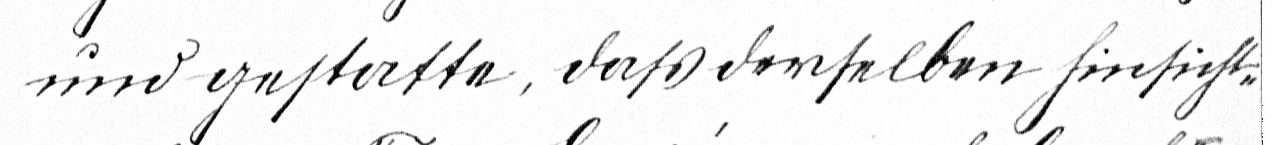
und gestatte, dass derselben hinsicht¬
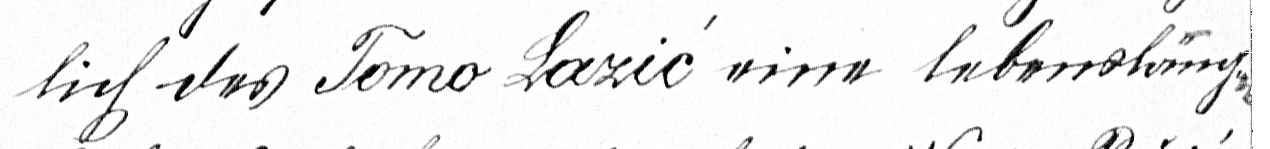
lich des Tomo Lazić eine lebensläng¬
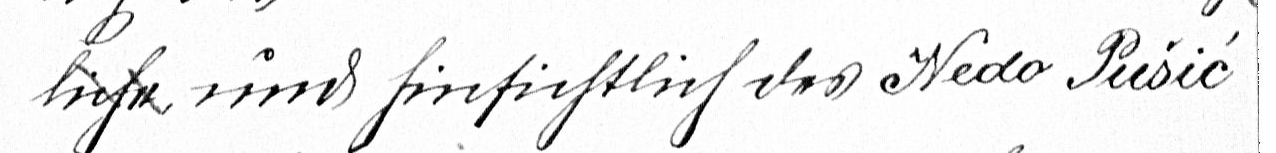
liche und hinsichtlich des Nedo Pusić
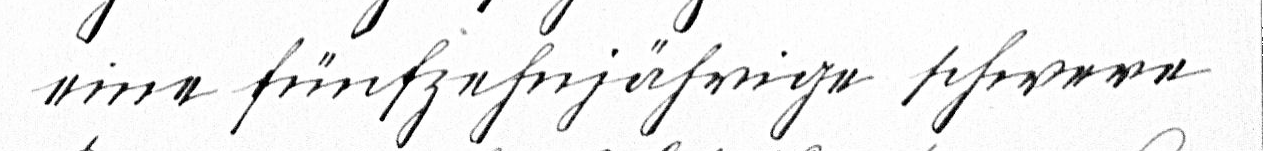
eine fünfzehnjährige schwere
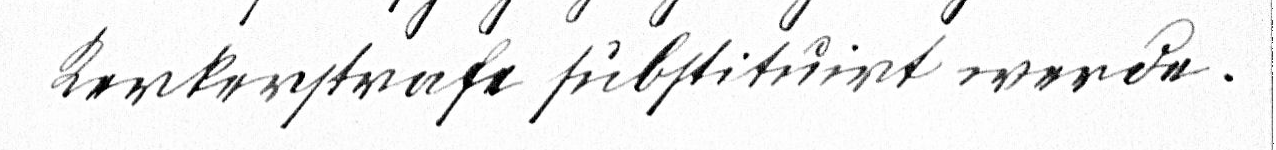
Kerkerstrafe substituirt werde.
